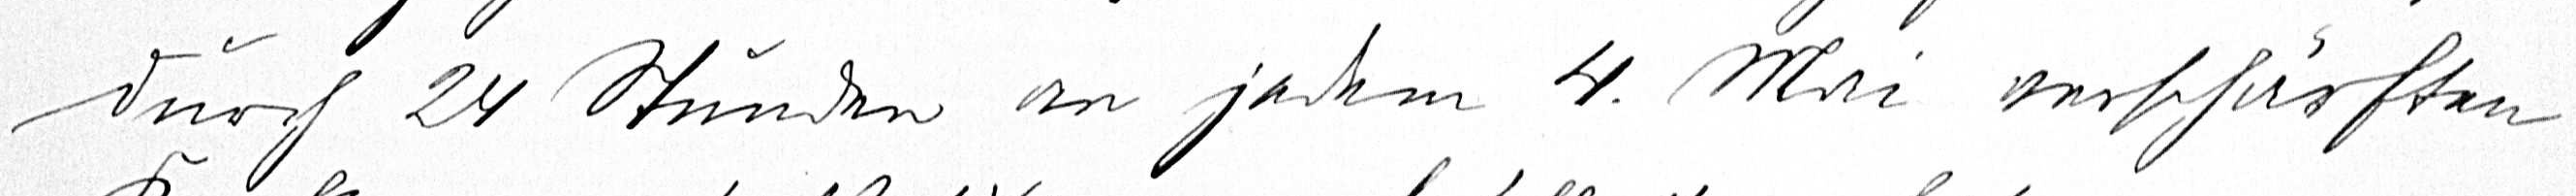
durch 24 Stunden an jedem 4. Mai verschärften
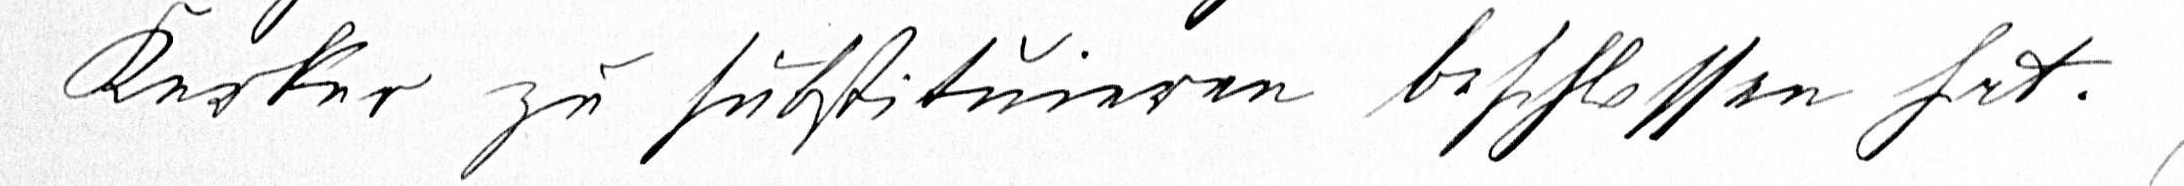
Kerker zu substituieren beschlossen hat.
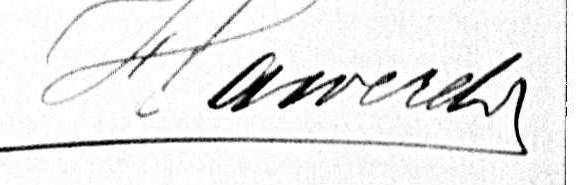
Hawerxx
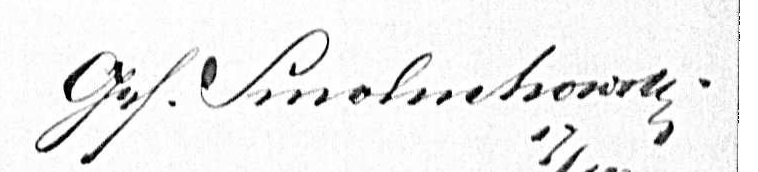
Ges. Schmolhowcki
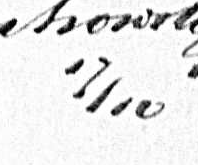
17/10
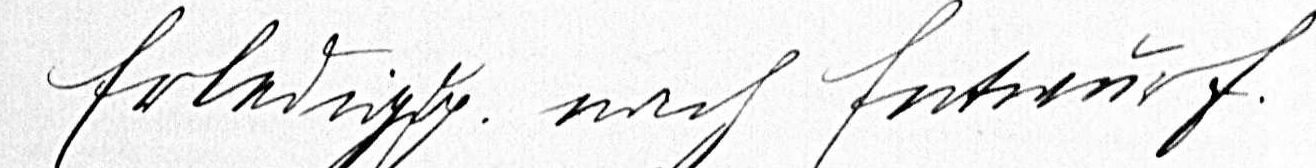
Erledigg. nach Entwurf.
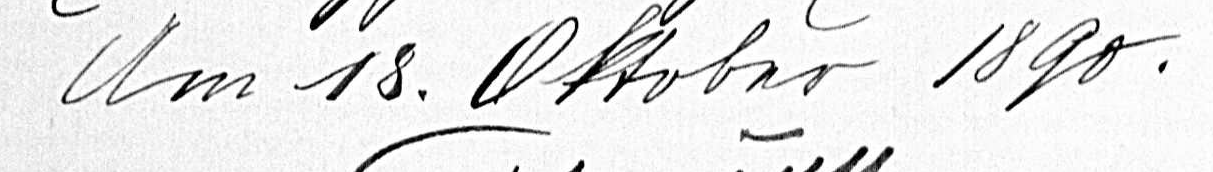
Am 18. Oktober 1890
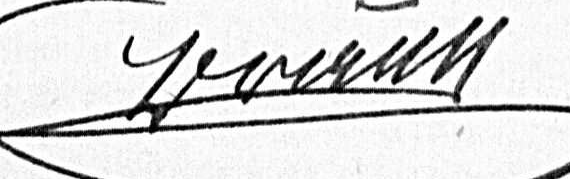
Braun
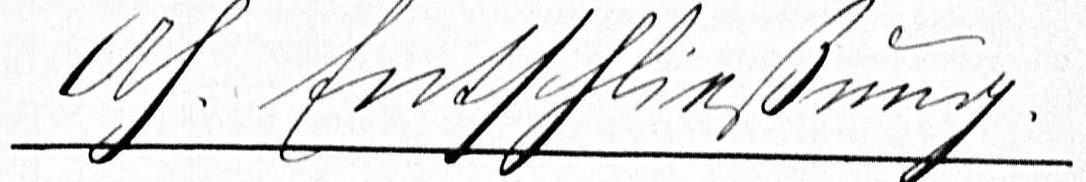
Ah. Entschließung.
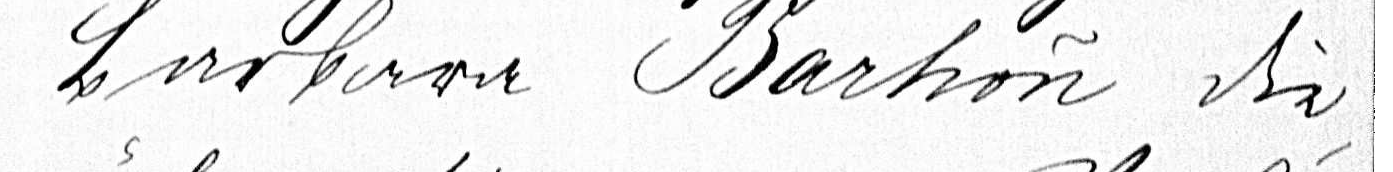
Barbara Barhön die
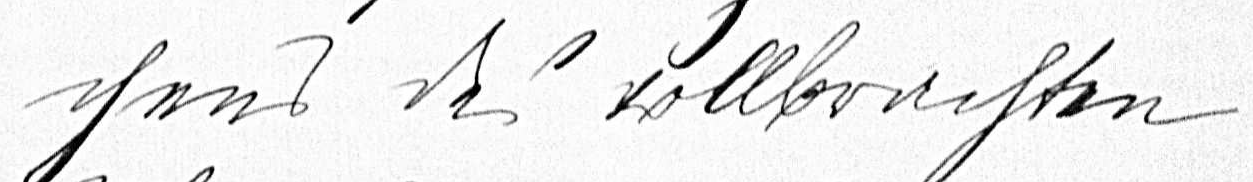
chens des vollbrachten
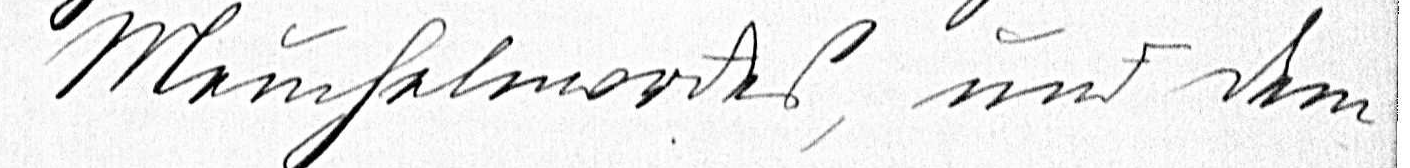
Meuchelmordes, und dem
